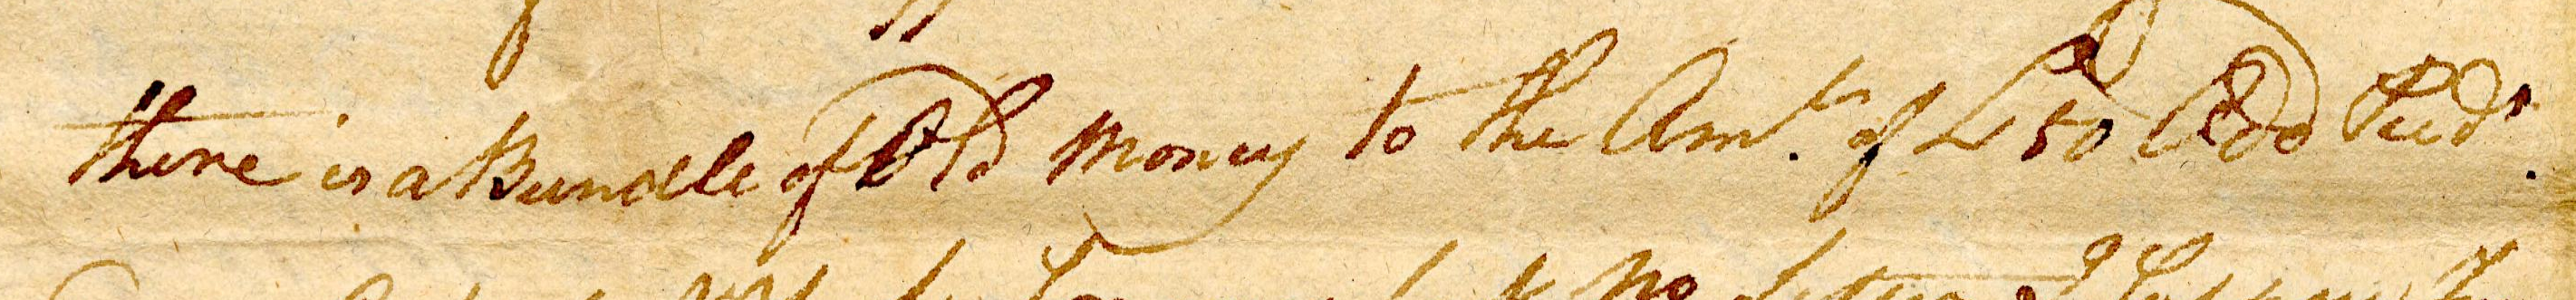there is a Bundle of Old money to the Am^t. of £50. & 66 pence
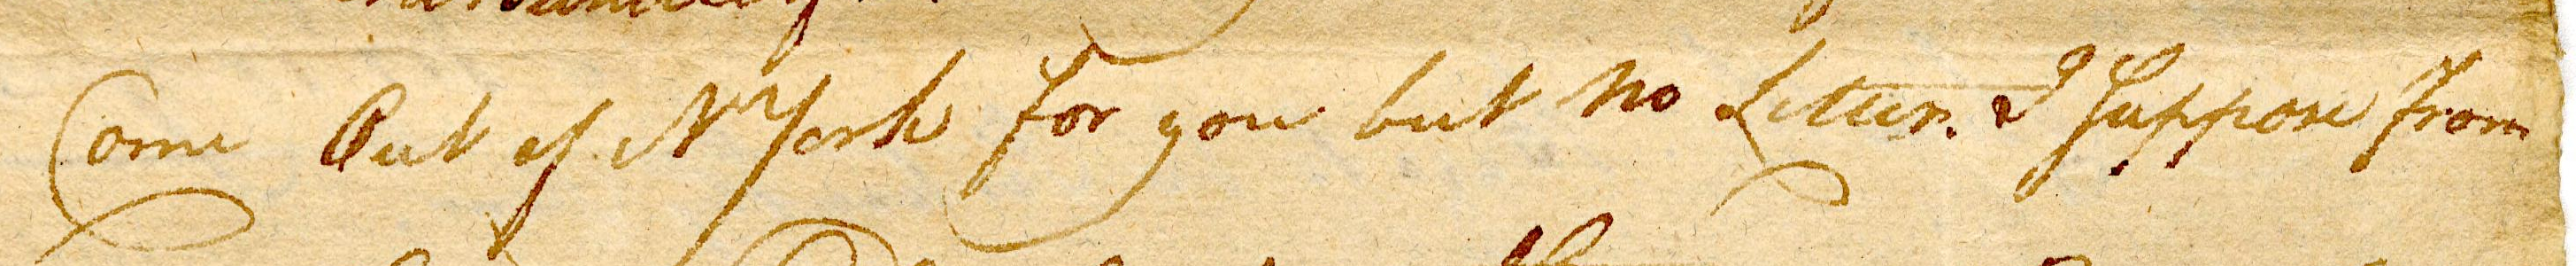Come out of N York for you but no Letter I suppose from
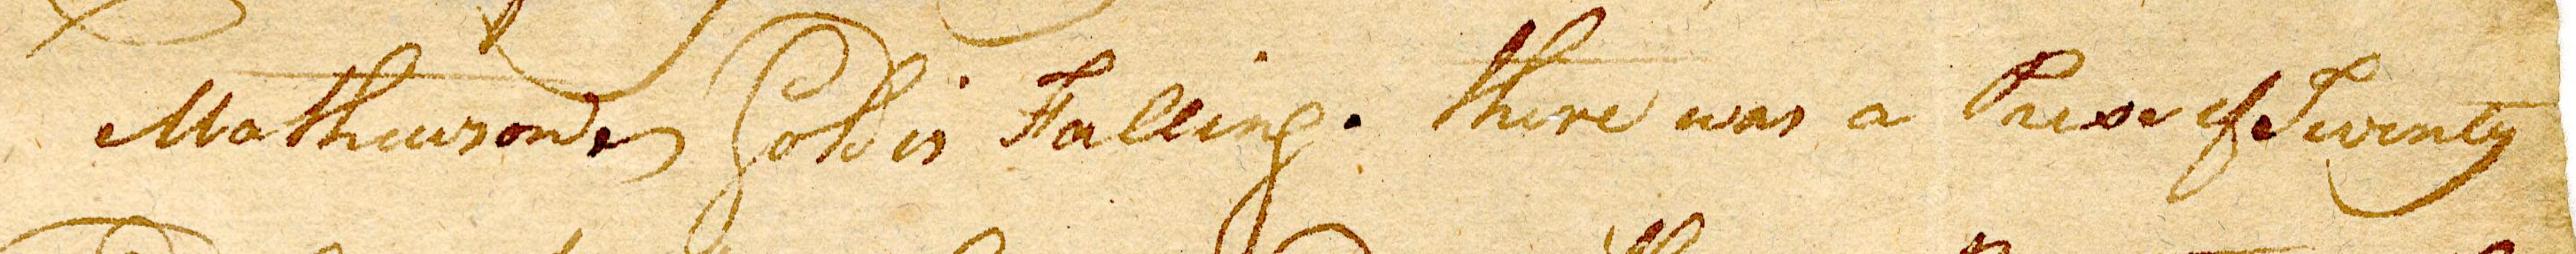Mathersand Gold is Falling. There was a Prise of Seventy
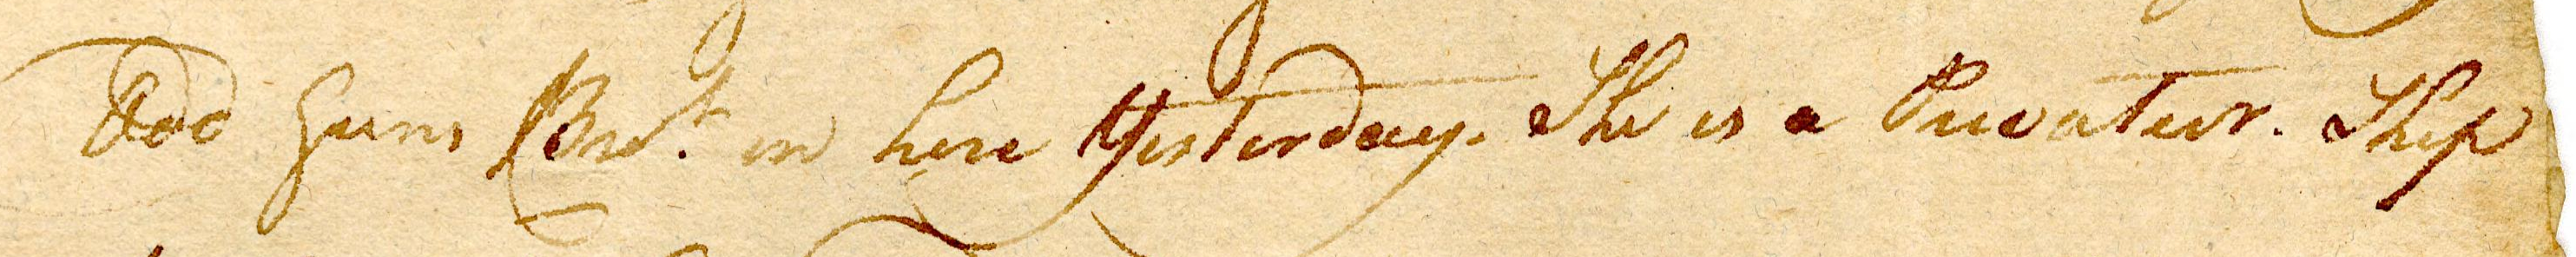Odd Guns Bro^t. in here Yesterday. She is a Privateer. Ship
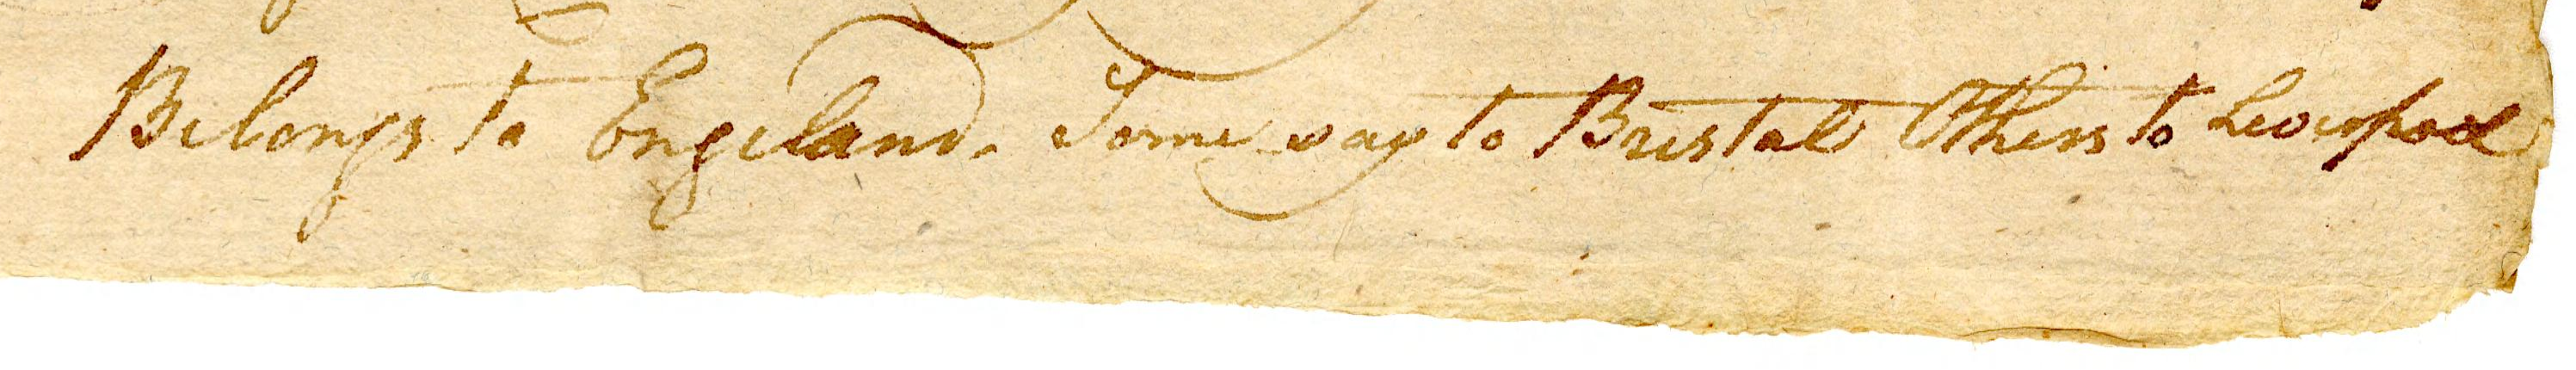belongs to England, some say to Bristal Others to Livepool
